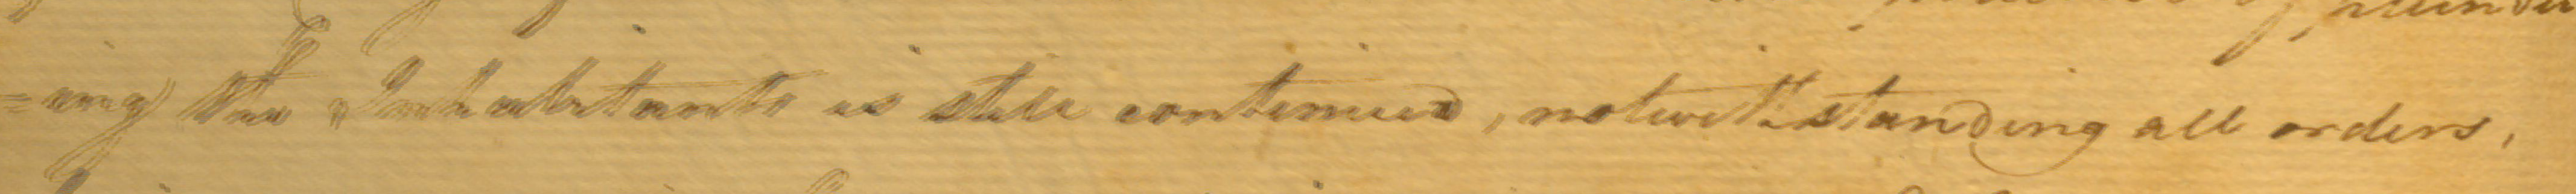-ing the Inhabitants is still continued, notwithstanding all orders,
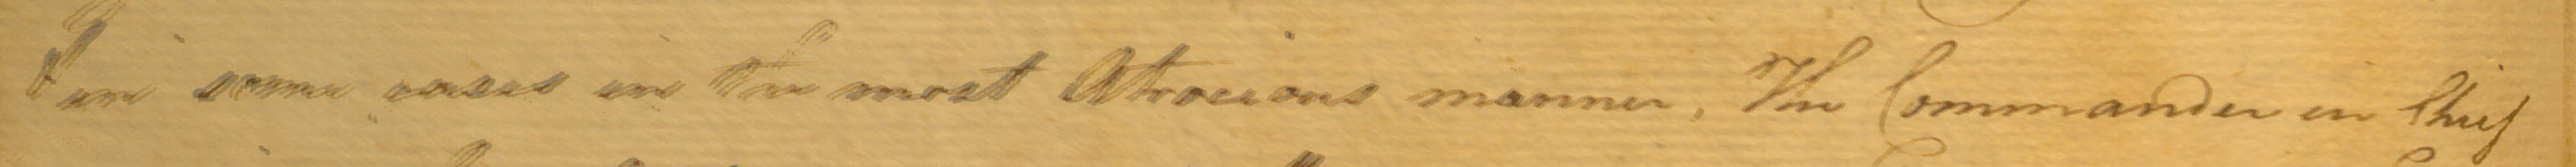& in some cases in the most Atrocious manner. The Commanded in Chief
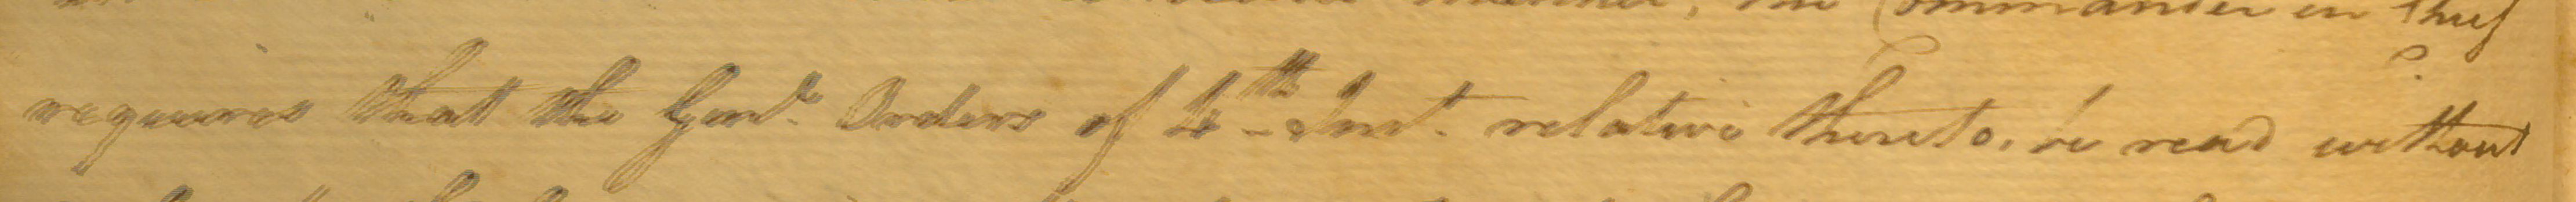requires that the Gen^l. Orders of the 4^th Ins^t. relative thereto be read without
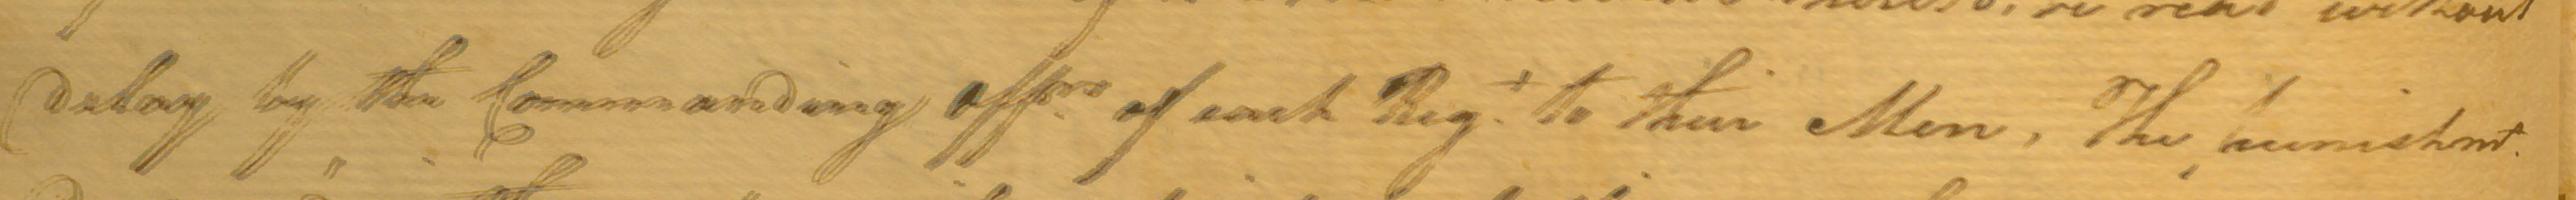delay by the Commanding Off^rs. of each Reg^t. to their Men. The punishm^t.
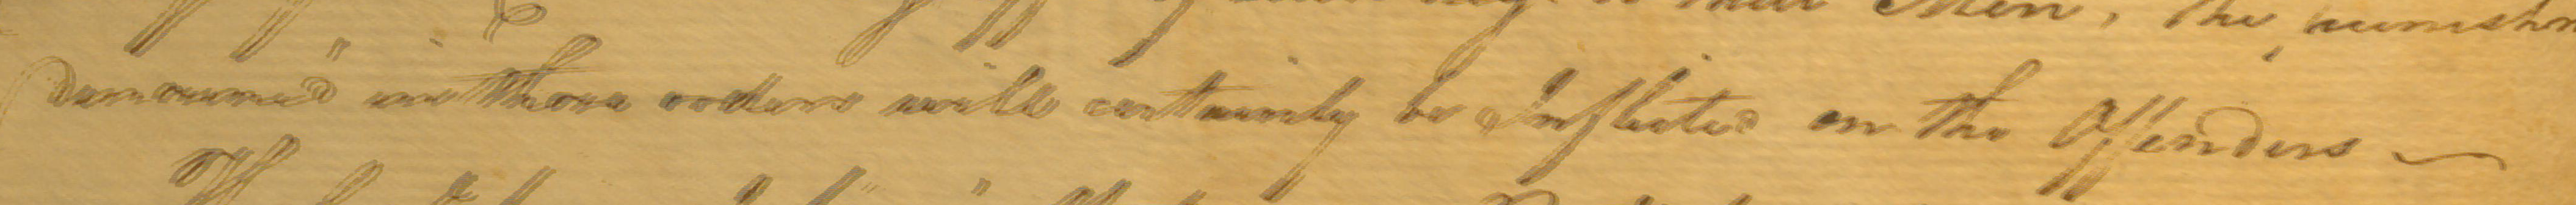demand'd in those orders will certainly be Inflict^d on the Offenders-
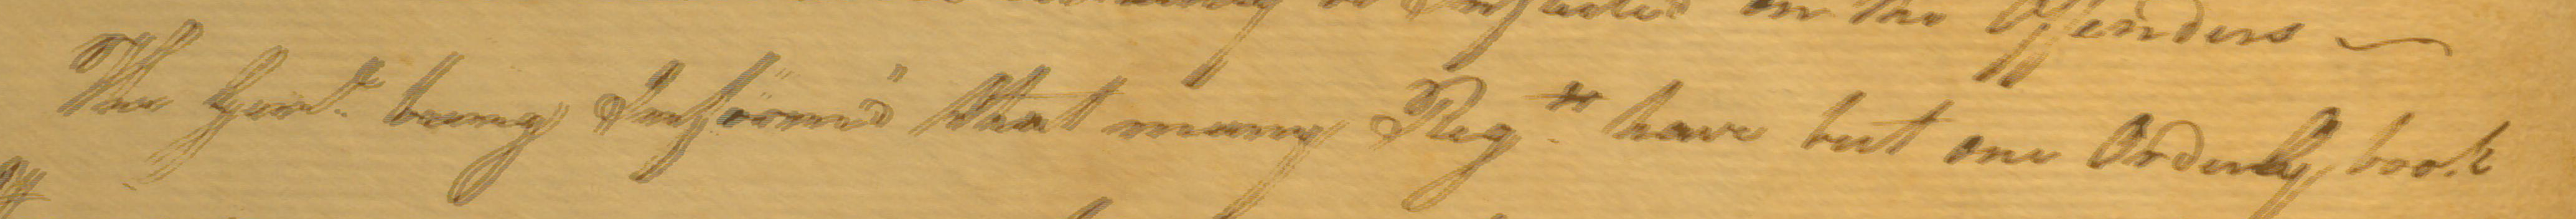The Gen^l. being Inform'd that many Reg^ts. have but one Orderly book
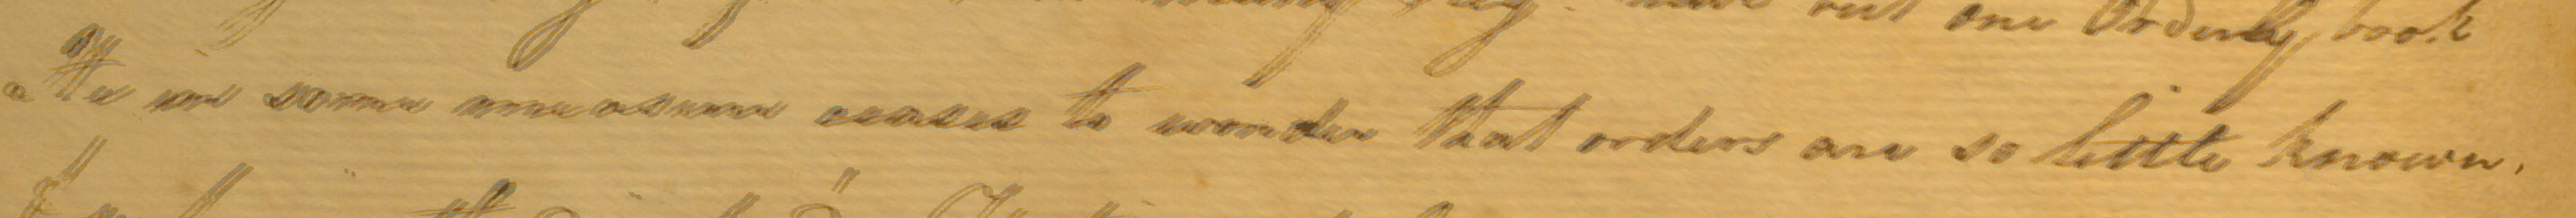He in some measure ceases to wonder that orders are so little known
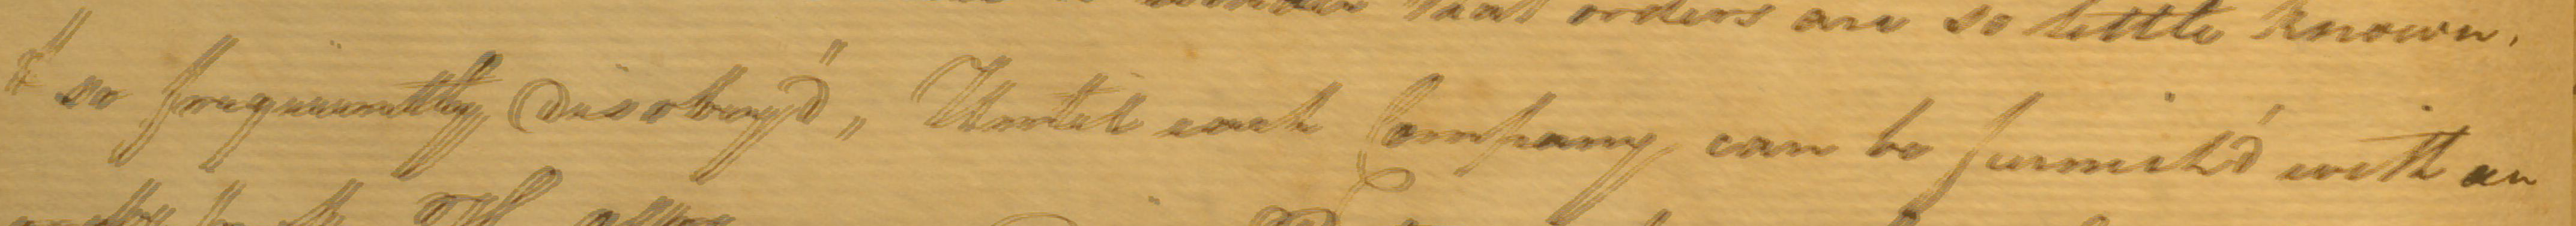& so frequently disobey'd. Until each Company can be furnish'd with an
